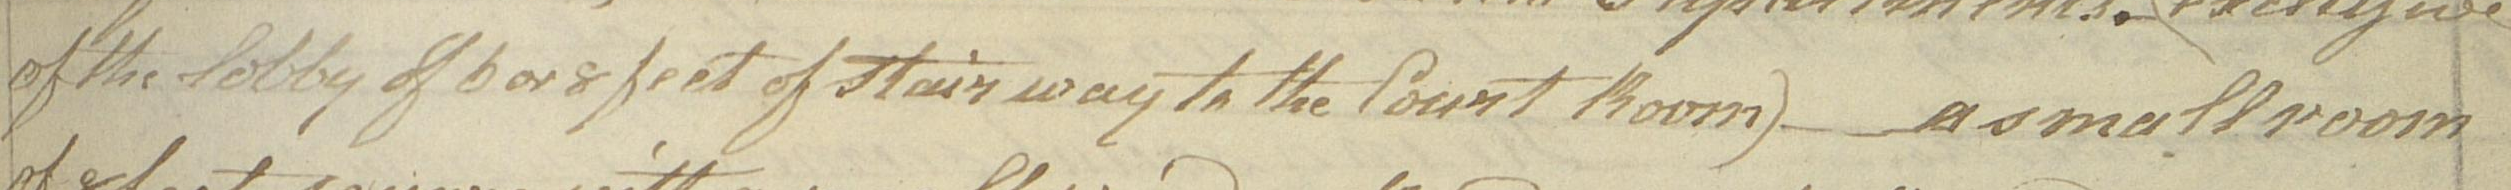of the lobby of 6 or 8 feet of Stairway to the Court Room) a small room
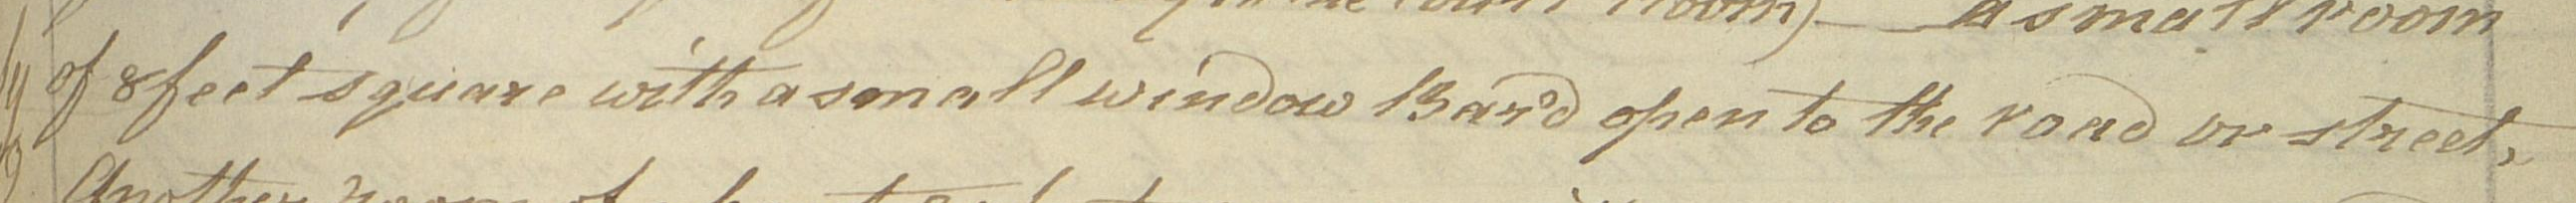of 8 feet square with a small window Bard open to the road or street,
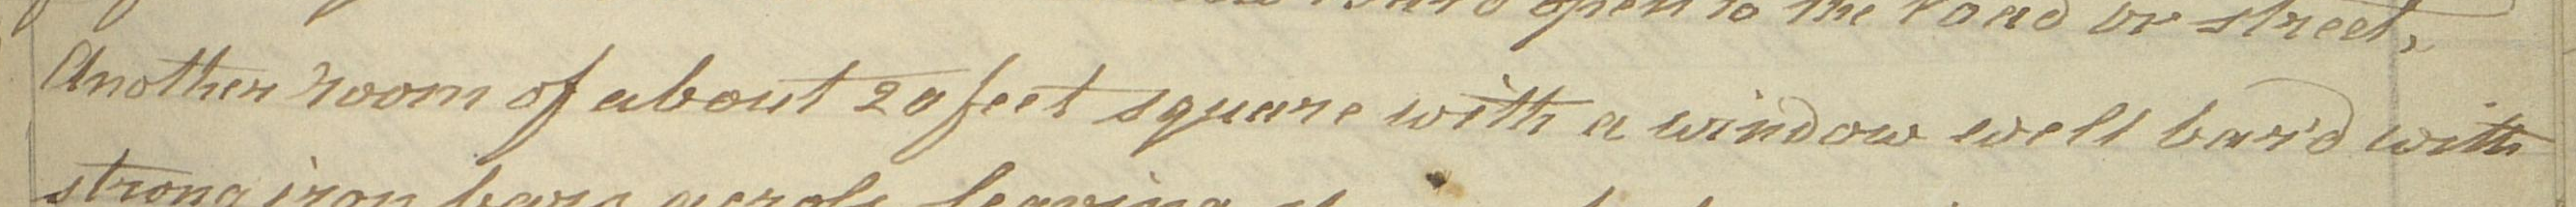Another room of about 20 feet square with a window well bard with
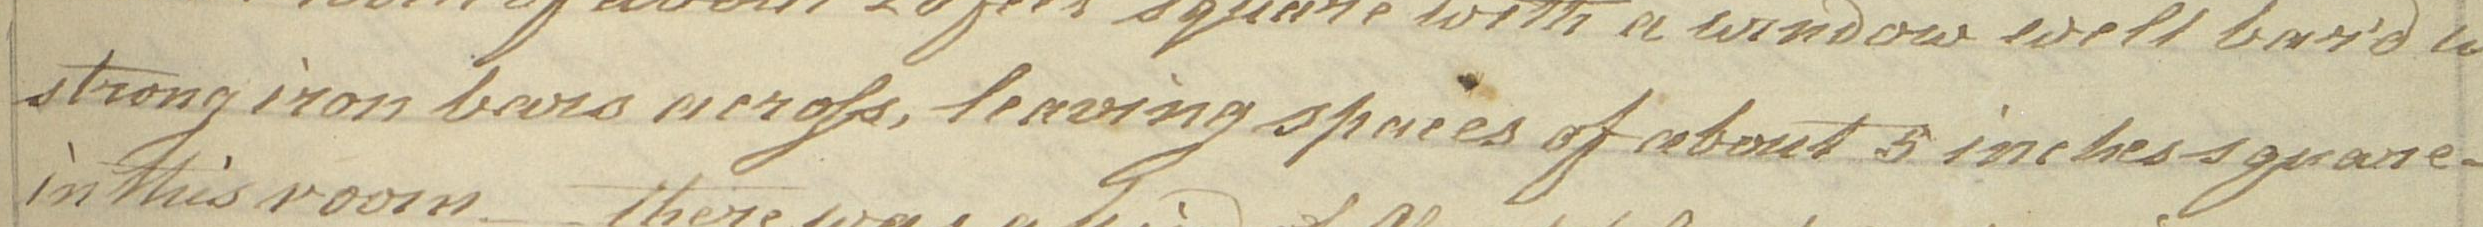strong iron bars across leaving spaces of about 5 inches square
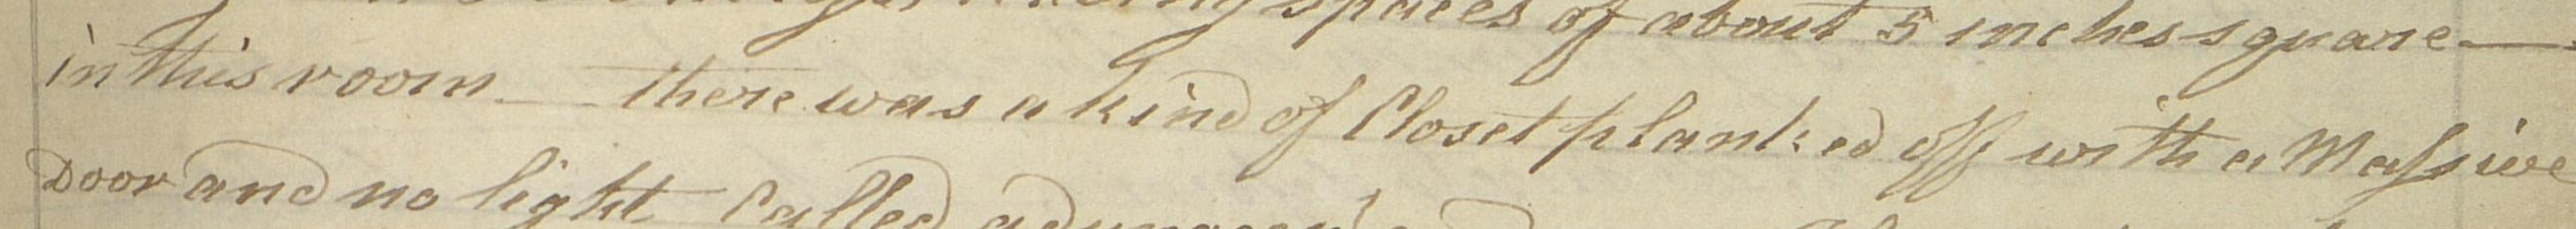in this room There was a kind of Closet planked off with a Massive
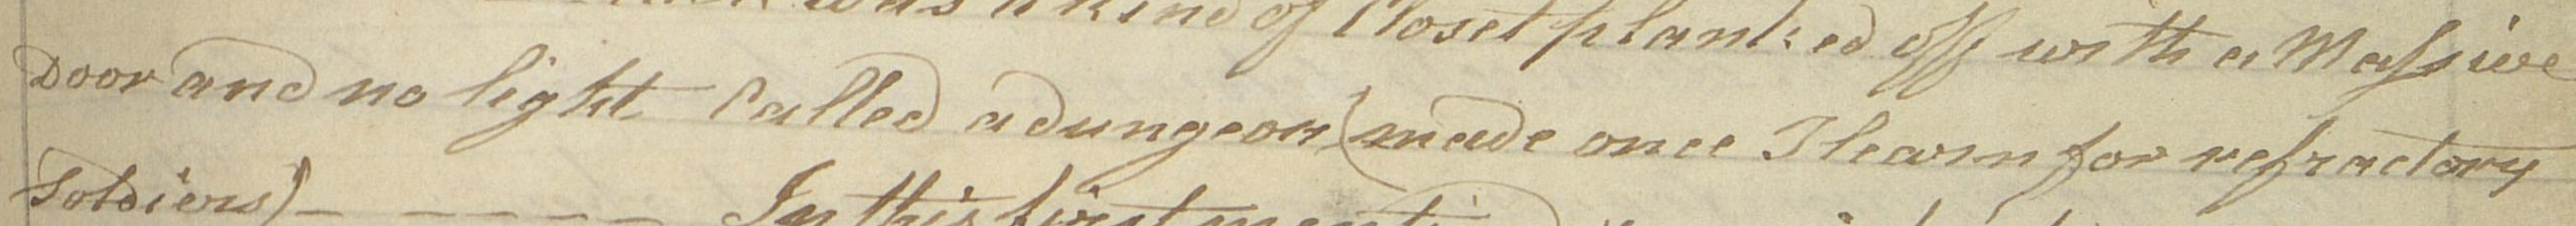Door and no light Called a dungeon (made once I learn for refractory
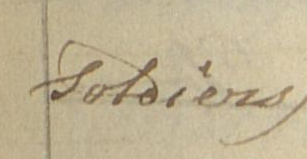Soldiers)
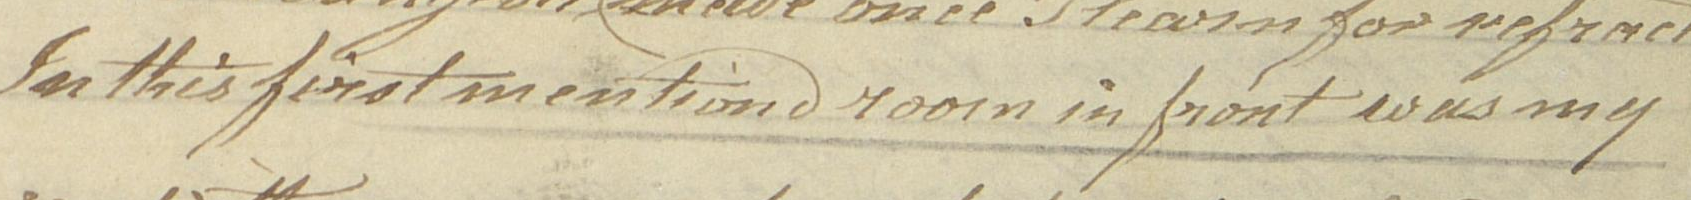In this first mentiond room in front was my
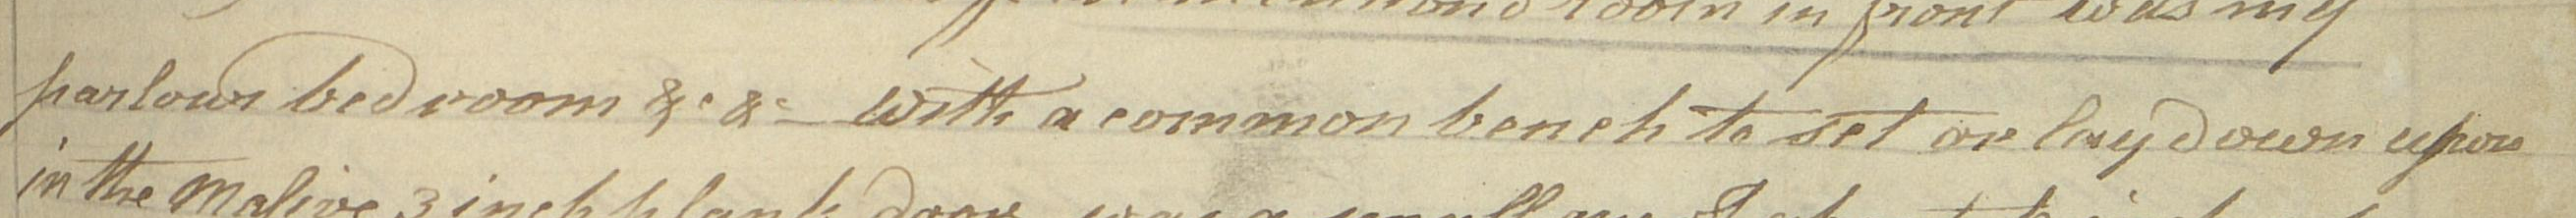parlour bed room &^c &^c with a common bench to set or lay down upon
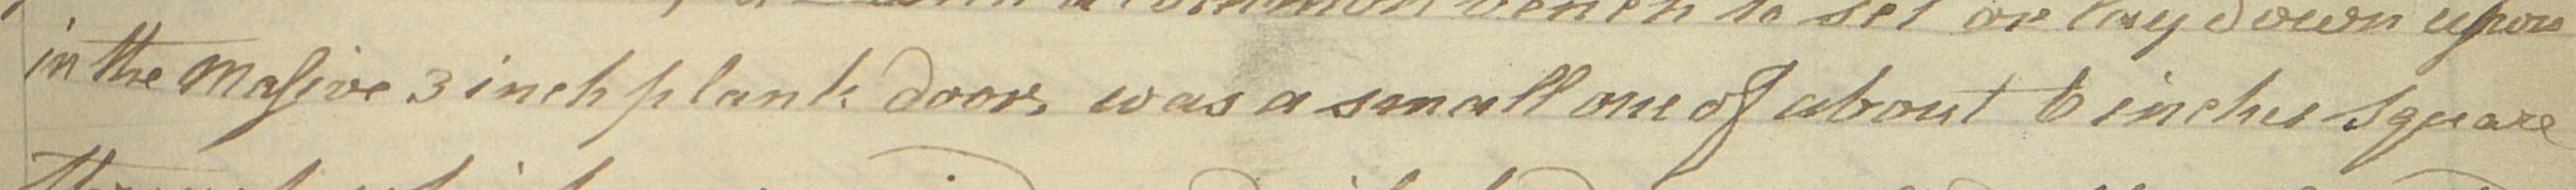in the Masive 3 inch plank door was a small one of about 6 inches Square
